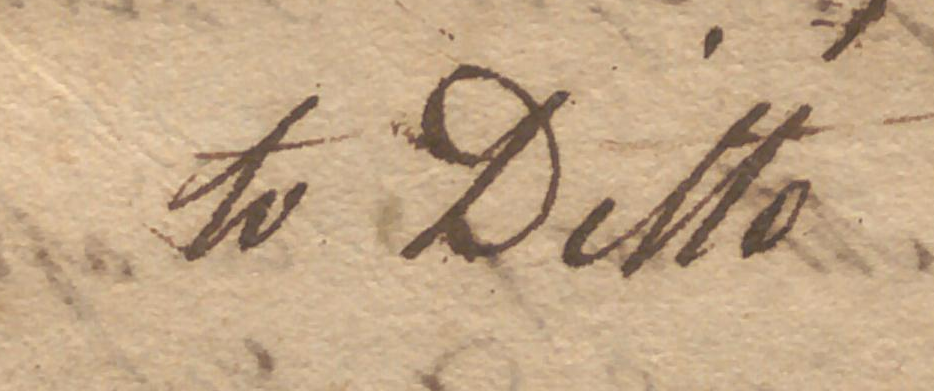to Ditto
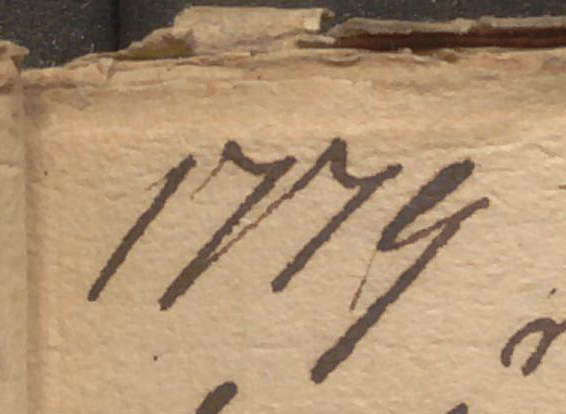1779
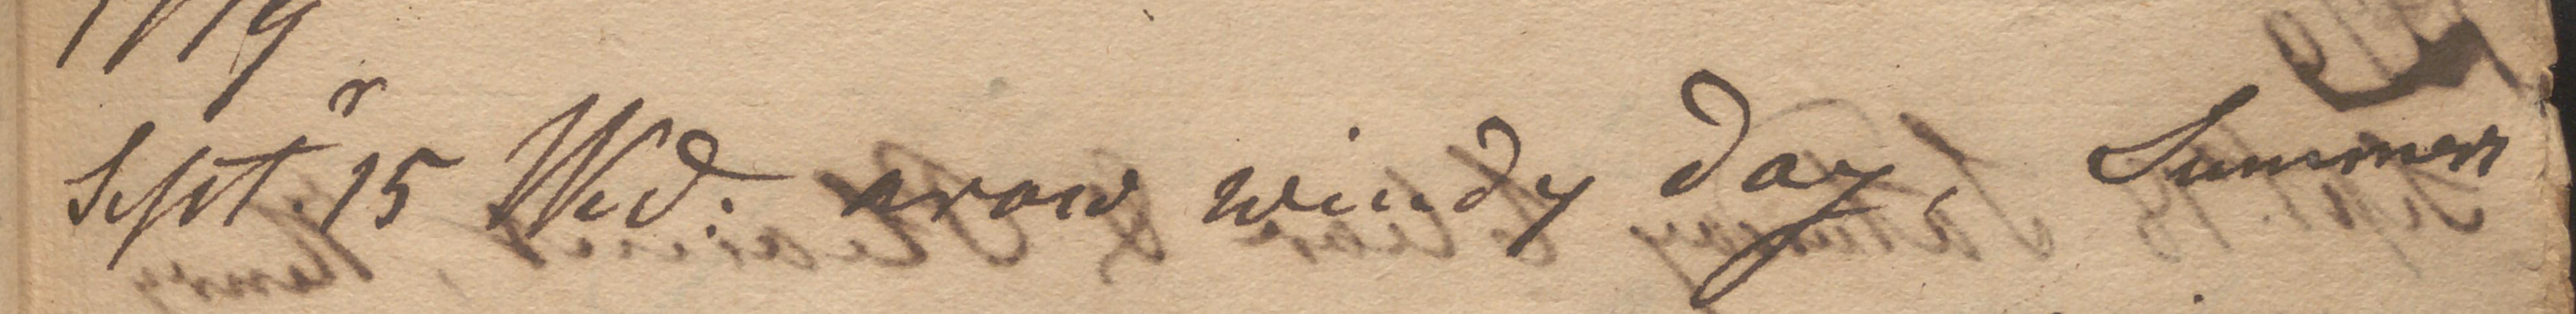Sept^r. 15 Wed: a raw windy day, Summers
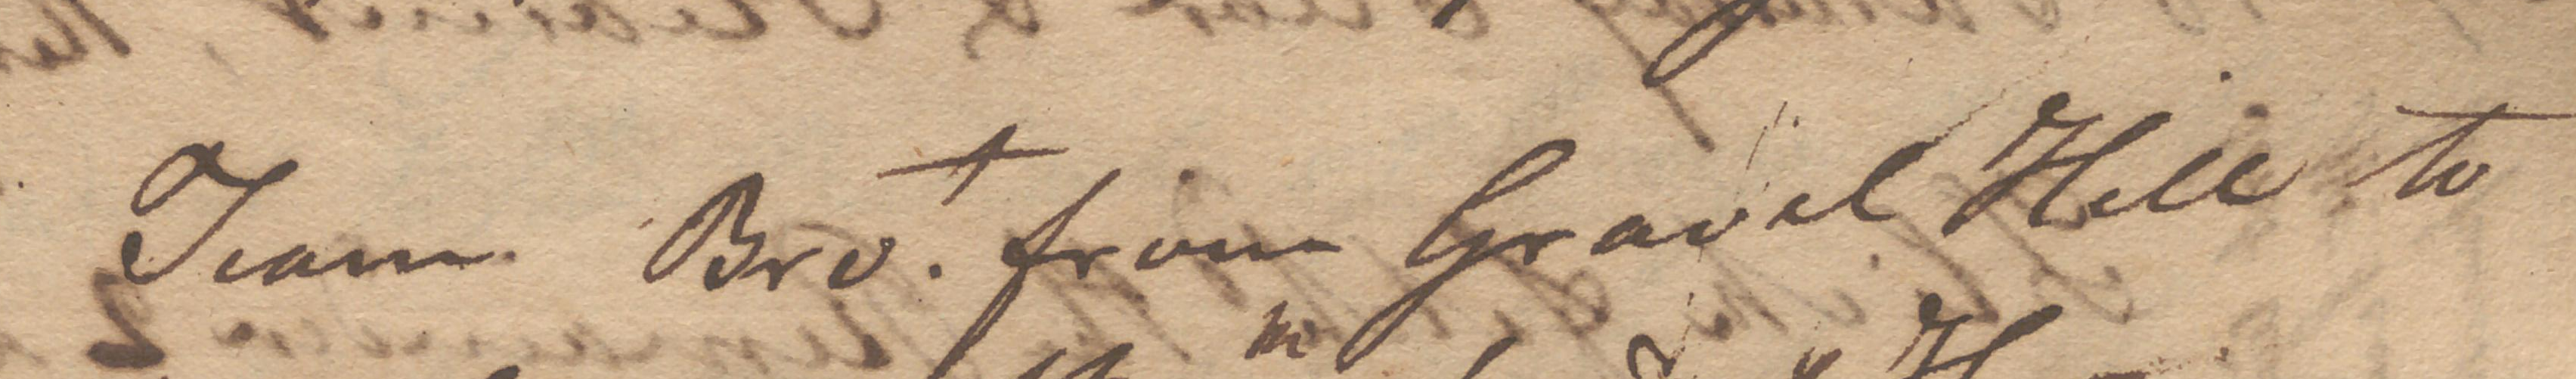Team Bro^t. from Gravel Hill to
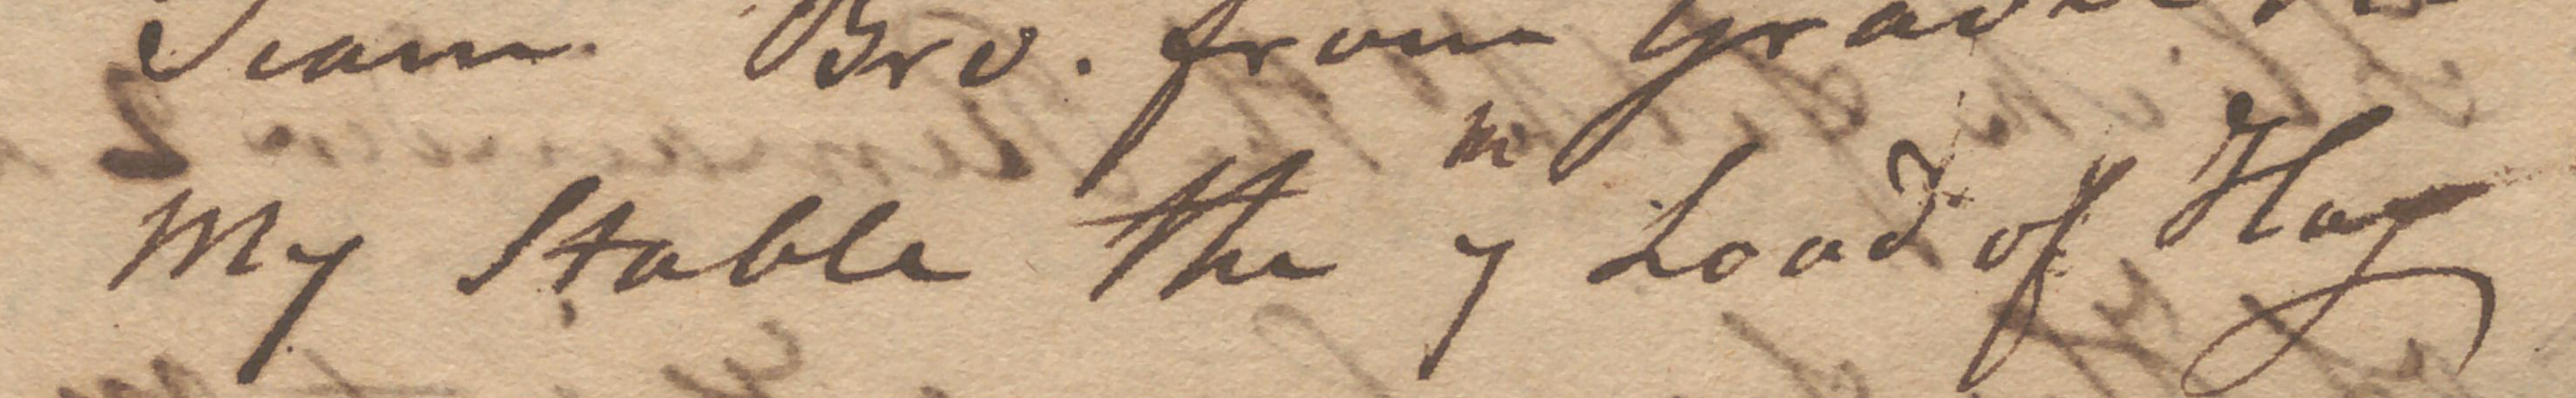My Stable the 7^th Load of Hay
